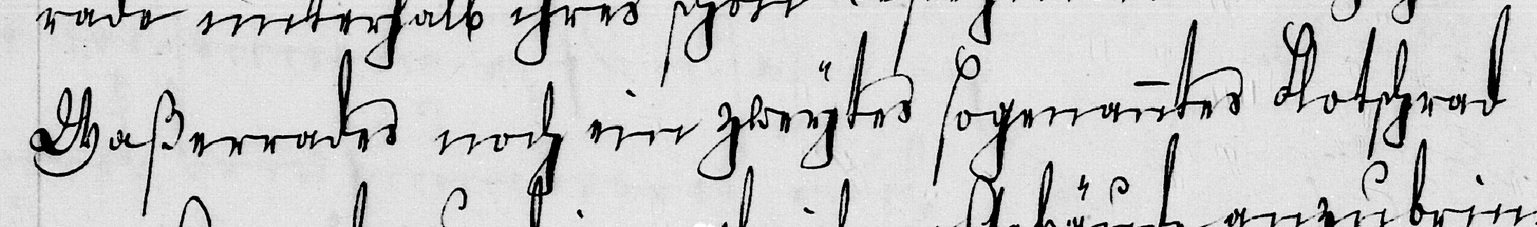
Waßerrades noch ein zweytes sogenanntes Flotschrad
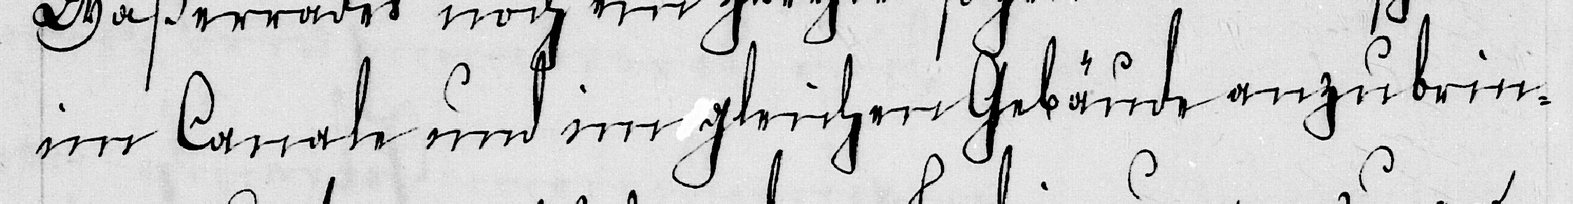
im Canale und im gleichen Gebäude anzubrin¬
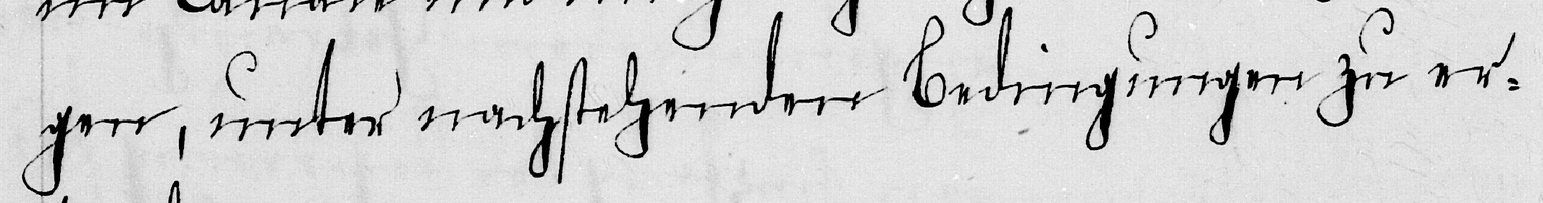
gen, unter nachstehenden Bedingungen zu er¬
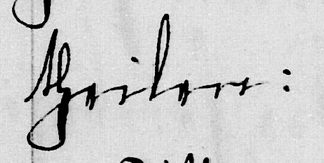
theilen:
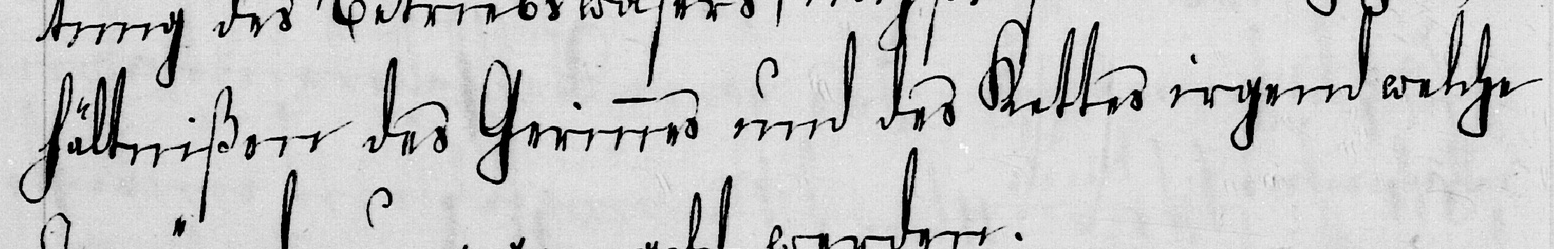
hältnißen des Gerinnes und des Kettes irgend welche
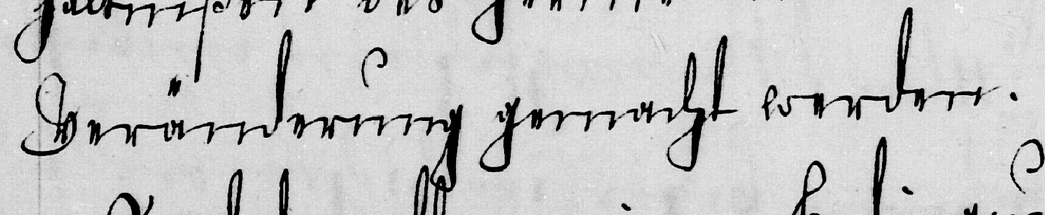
Veränderung gemacht werden.
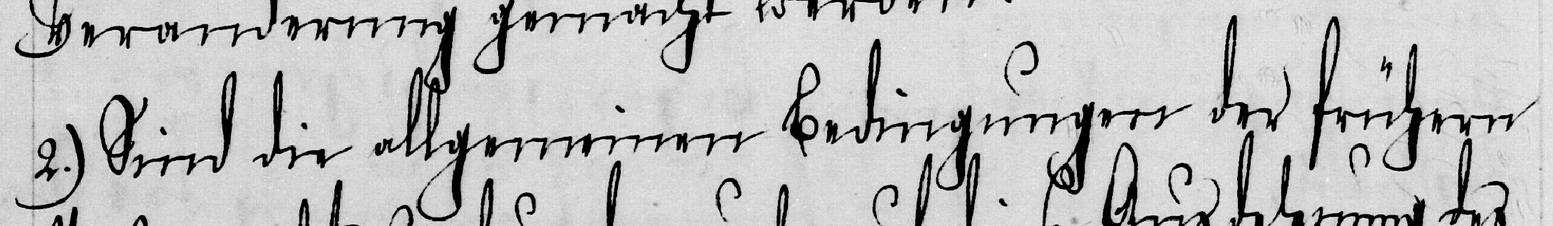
2.) Sind die allgemeinen Bedingungen der frühern
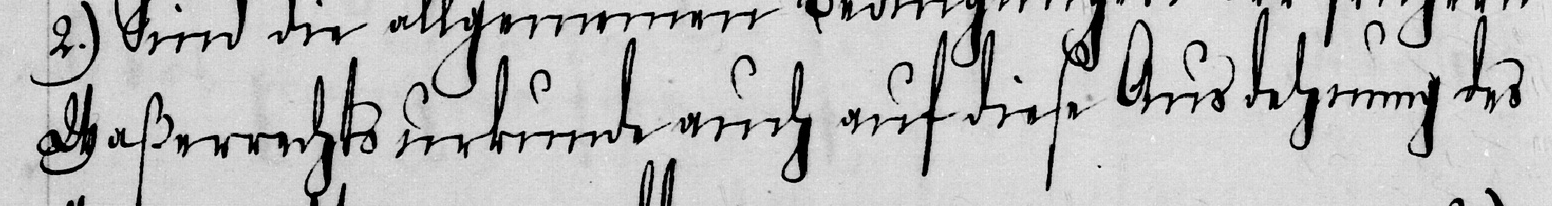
Waßerrechtsurkunde auch auf diese Ausdehnung des
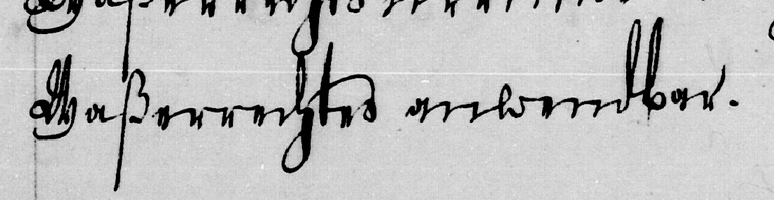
Waßerrechtes anwendbar.
